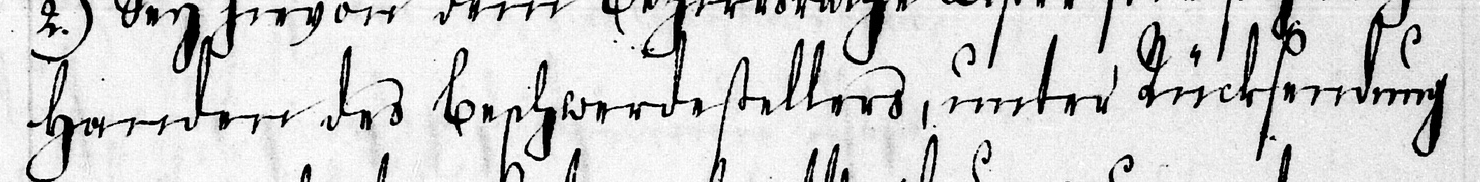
Handen des Beschwerdestellers, unter Rücksendung
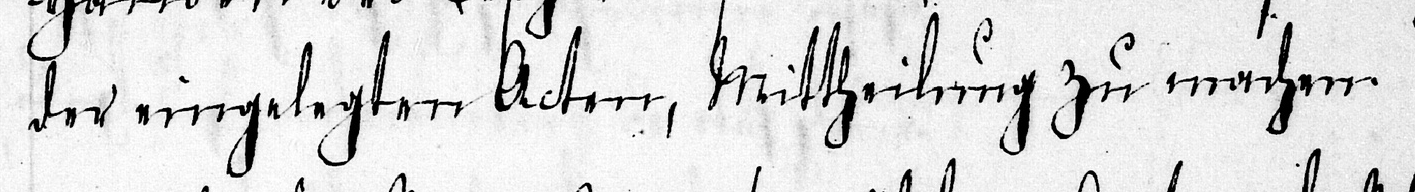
der eingelegten Acten, Mittheilung zu machen.
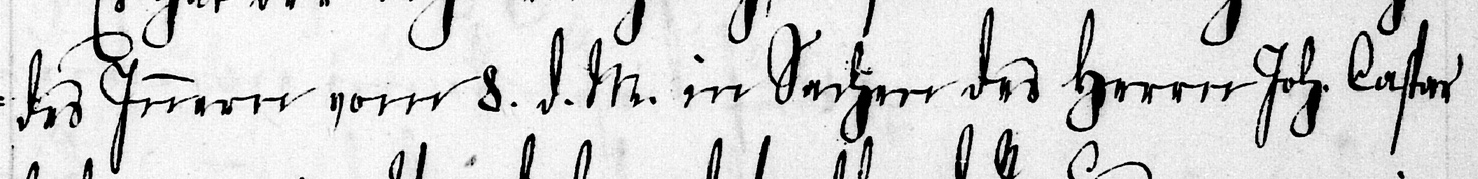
des Innern vom 8. d. M. in Sachen des Herrn Joh. Caspar
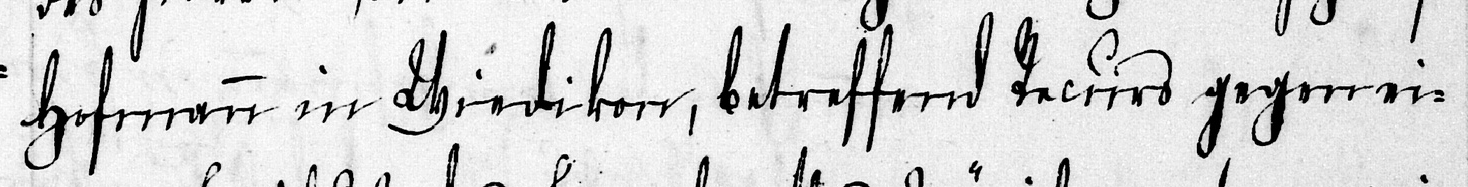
Hofmann in Wiedikon, betreffend Recurs gegen ei¬
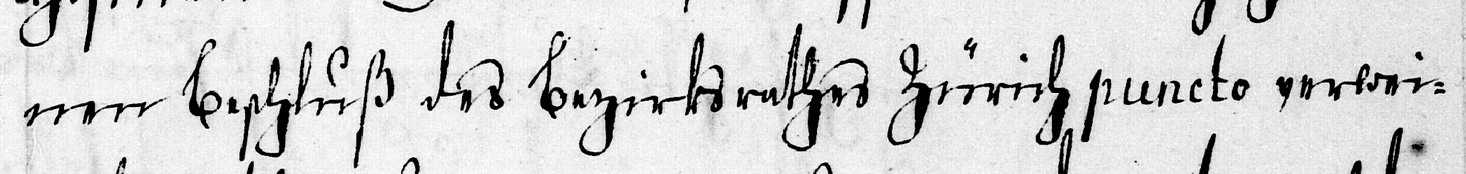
nen Beschluß des Bezirksrathes Zürich puncto verwei¬
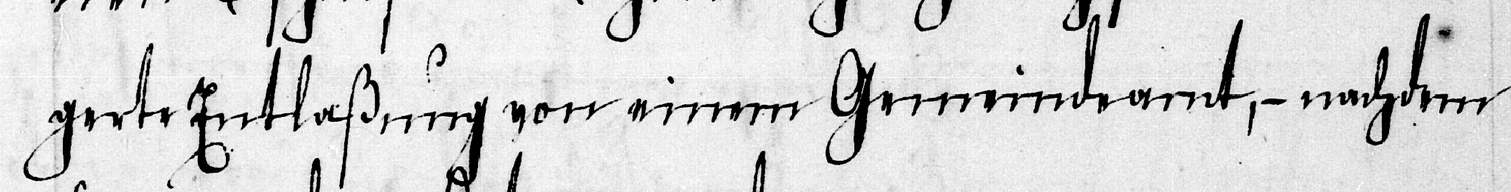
gerte Entlaßung von einem Gemeindeamt, – nachdem
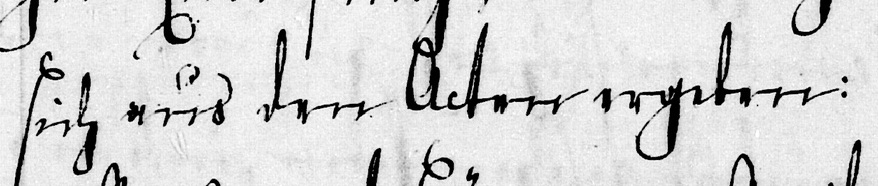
sich aus den Acten ergeben:
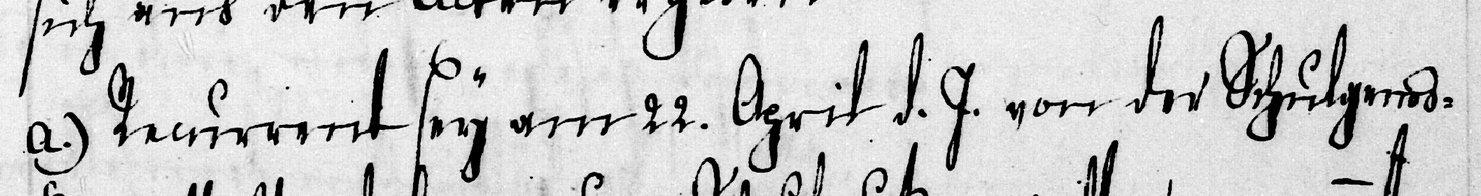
a.) Recurrent sey am 22. April d. J. von der Schulgenoße¬
